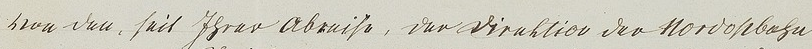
Von den, seit Ihrer Abreise der Direktion der Nordostbahn
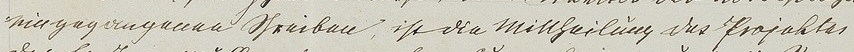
eingegangenen Schreiben, ist die Mittheilung des Projektes
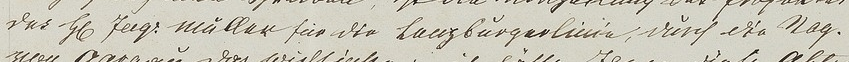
des Herrn IngrMüller für die Lenzburgerlinie, durch die Reg.
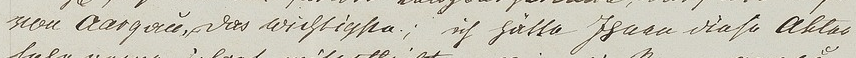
von Aargau, das wichtigste; ich hätte Ihnen diese Akten
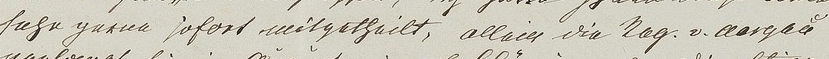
sehr gerne sofort mitgetheilt, allein die Reg. v. Aargau
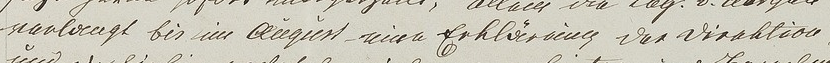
verlangt bis im August eine Erklärung der Direktion
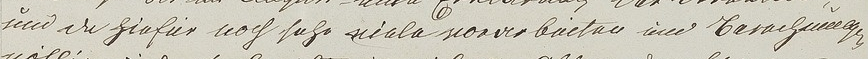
und da hiefür noch sehr viele Vorarbeiten und Berechnungen
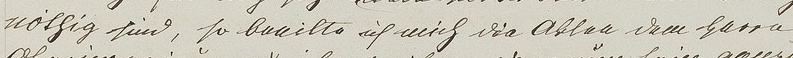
nöthig sind, so beeilte ich mich die Akten dem Herrn
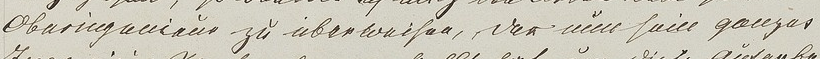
Oberingenieur zu überweisen, der nun sein ganzes
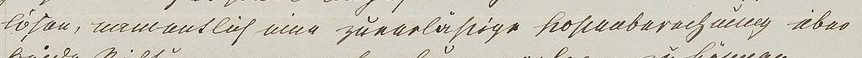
lösen, namentlich eine zuverlässige Kostenberechnung über
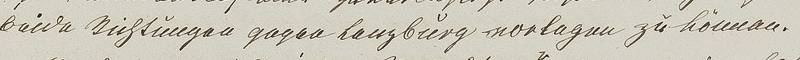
beide Richtungen gegen Lenzburg vorlegen zu können.
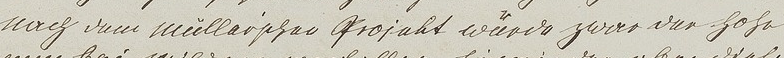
Nach dem Müllerschen Projekt würde zwar der hohe
